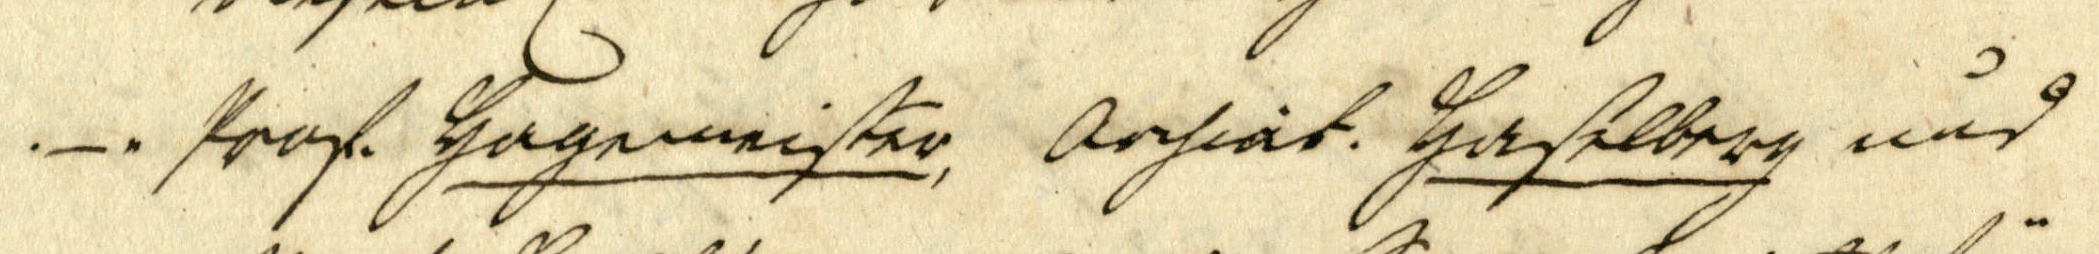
Prof. Hagemeister, Archiat. Haselberg und
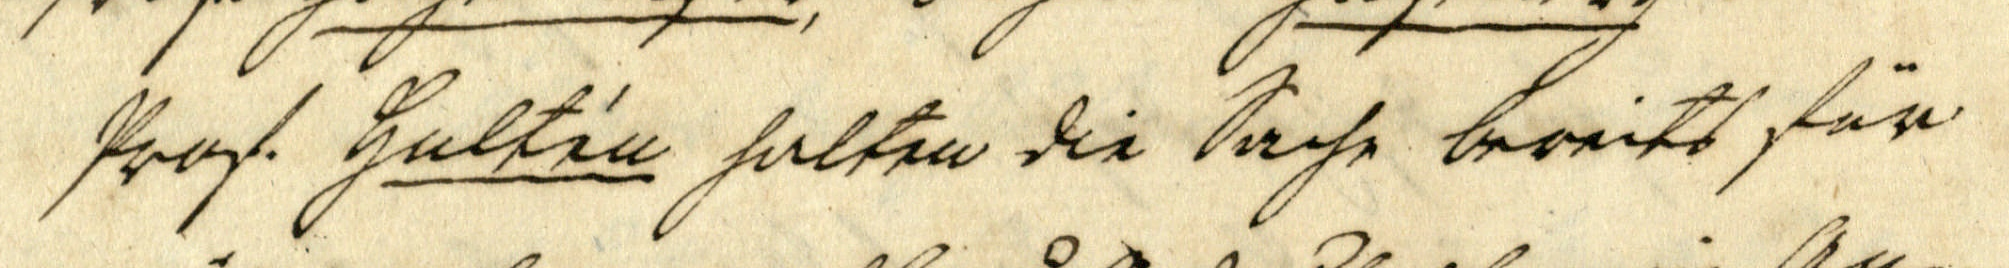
Prof. Hultén halten die Sache bereits für
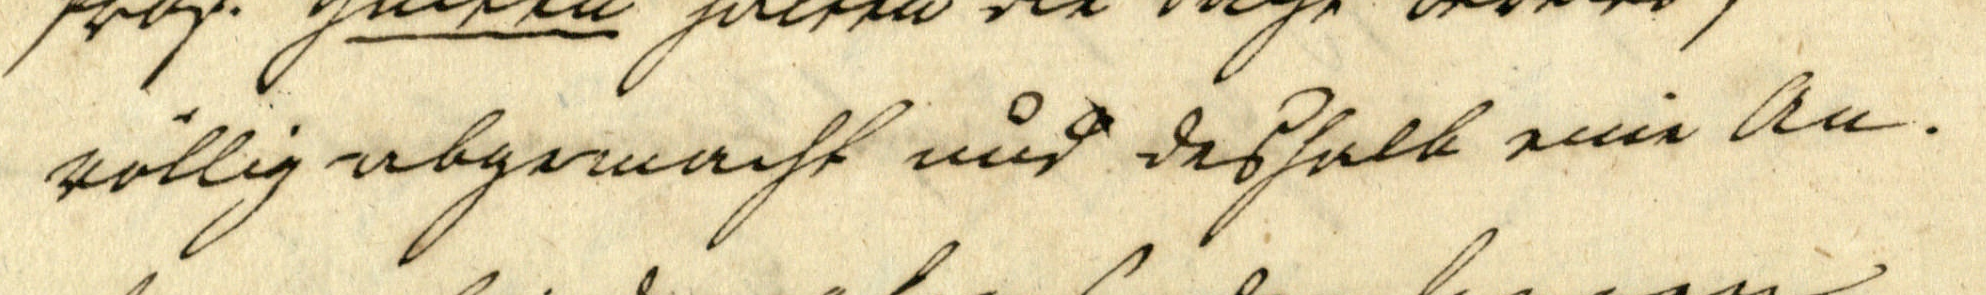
völlig abgemacht und deshalb eine An¬
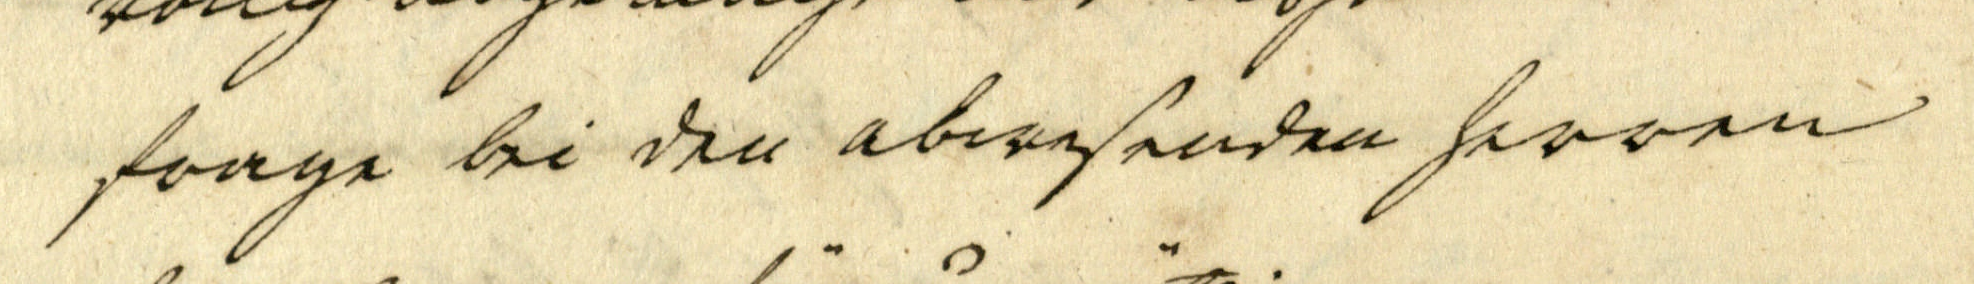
frage bei den abwesenden Herren
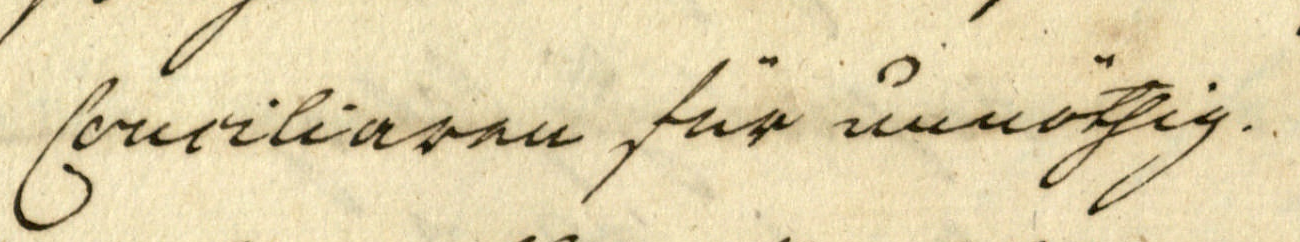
Conciliaren für unnöthig.
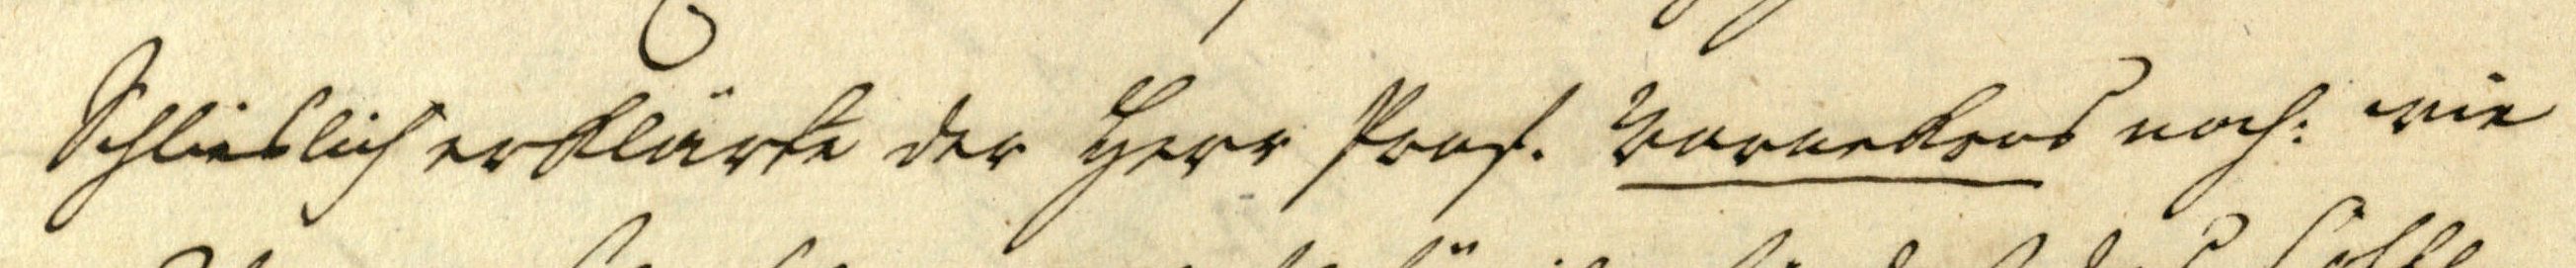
Schlieslich erklärte der Herr Prof. Warnekros noch: wie
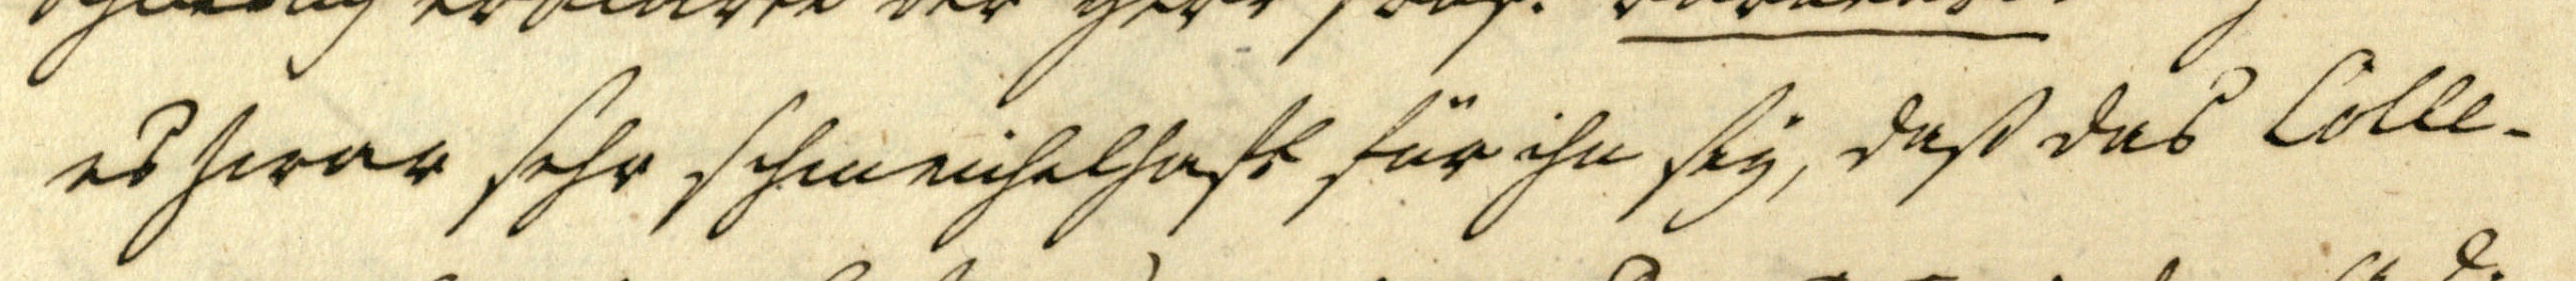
es zwar sehr schmeichelhaft für ihn seÿ, daß das Colle¬
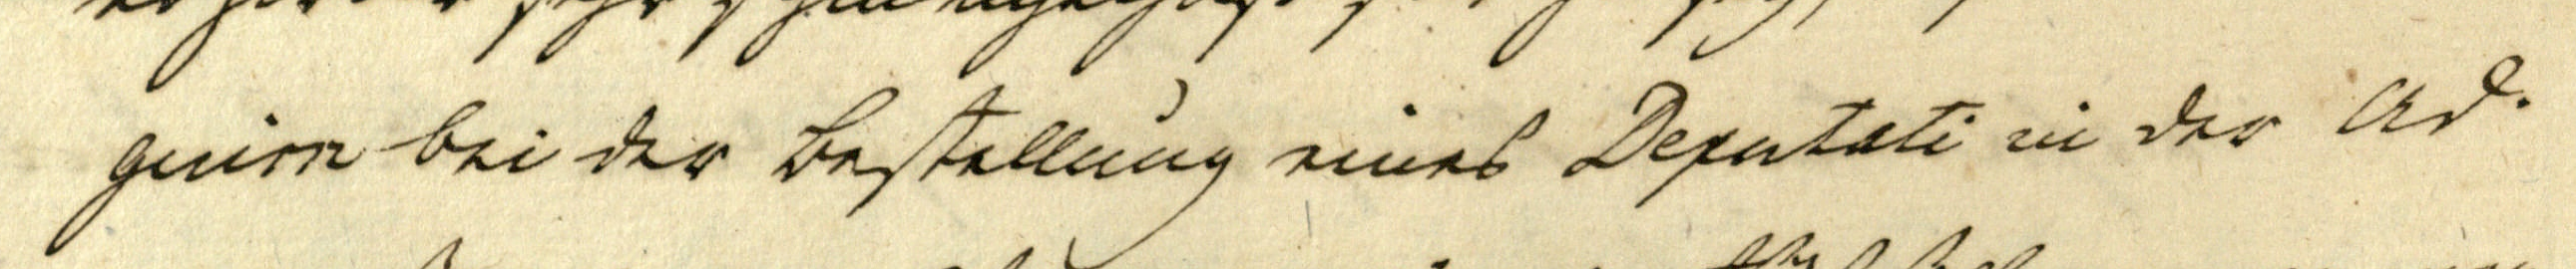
gium bei der Bestellung eines Deputati in der Ad¬
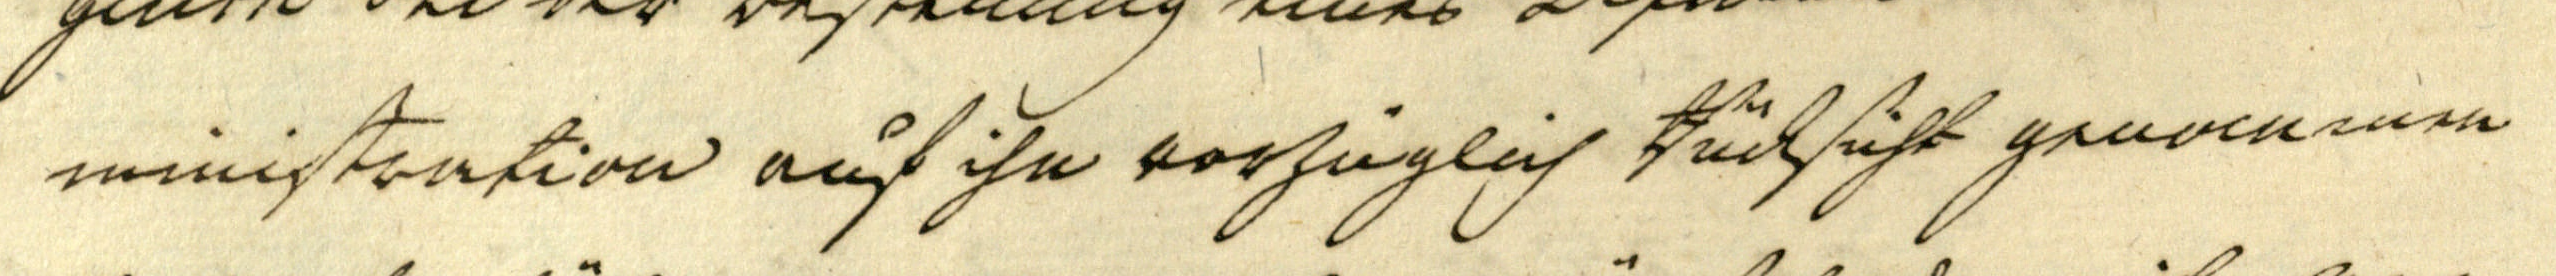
ministration auf ihn vorzüglich Rücksicht genommen
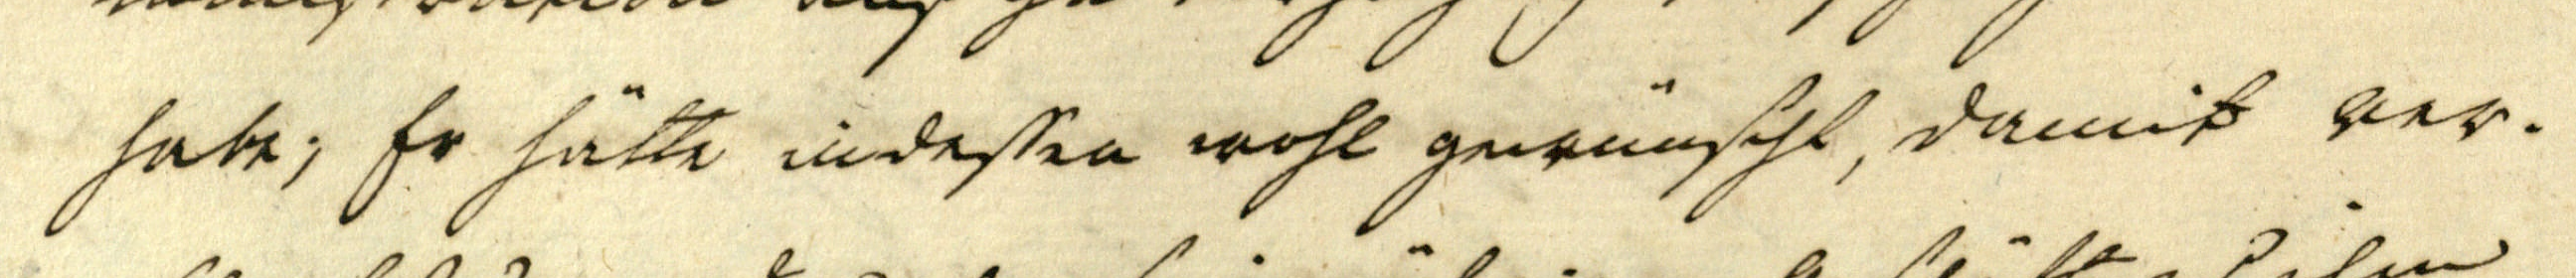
habe, Er hätte indessen wohl gewünscht, damit ver¬
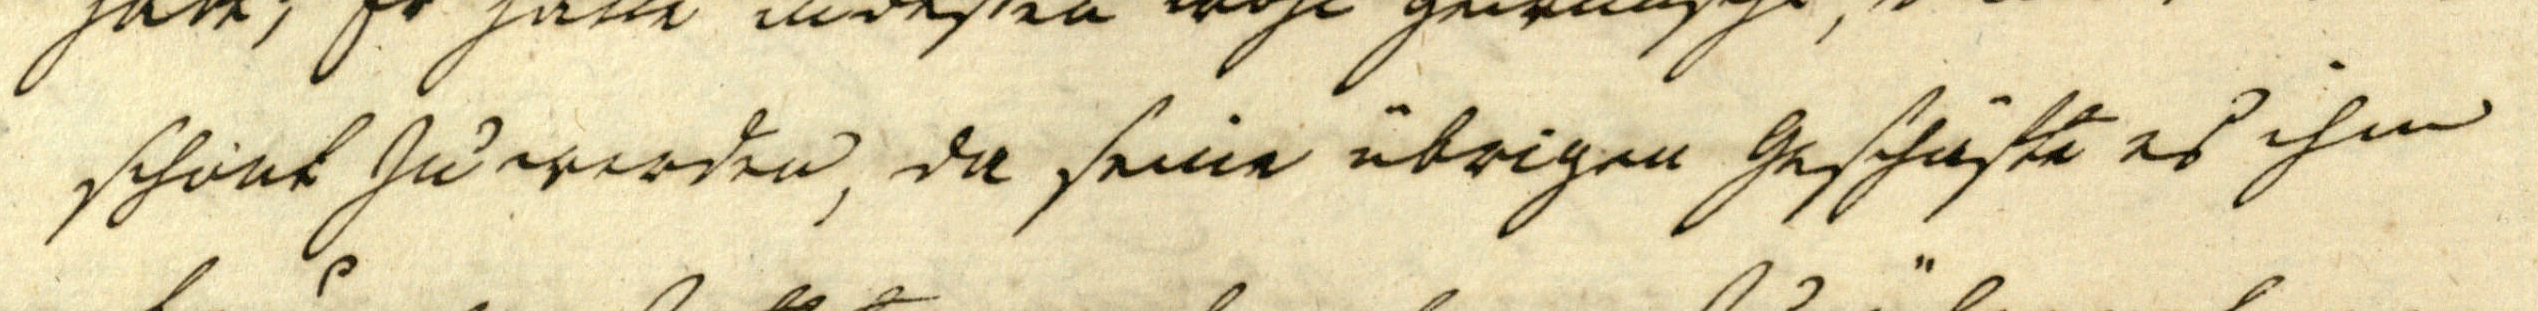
schont zu werden, da seine übrigen Geschäfte es ihm
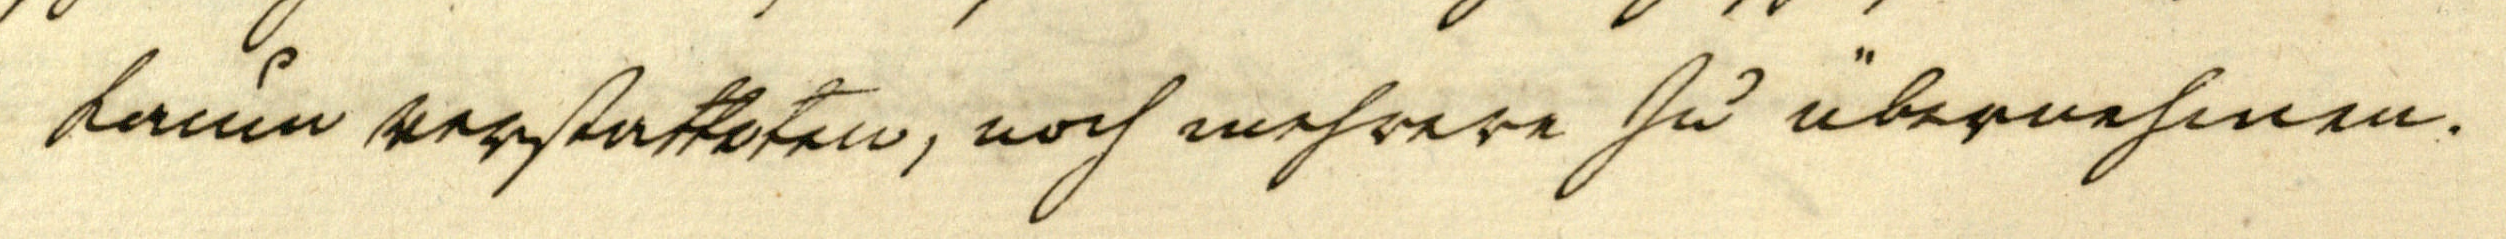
kaum verstatteten, noch mehrere zu übernehmen.
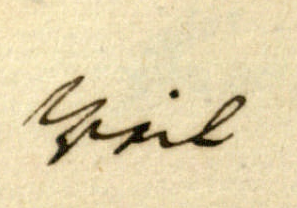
weil
